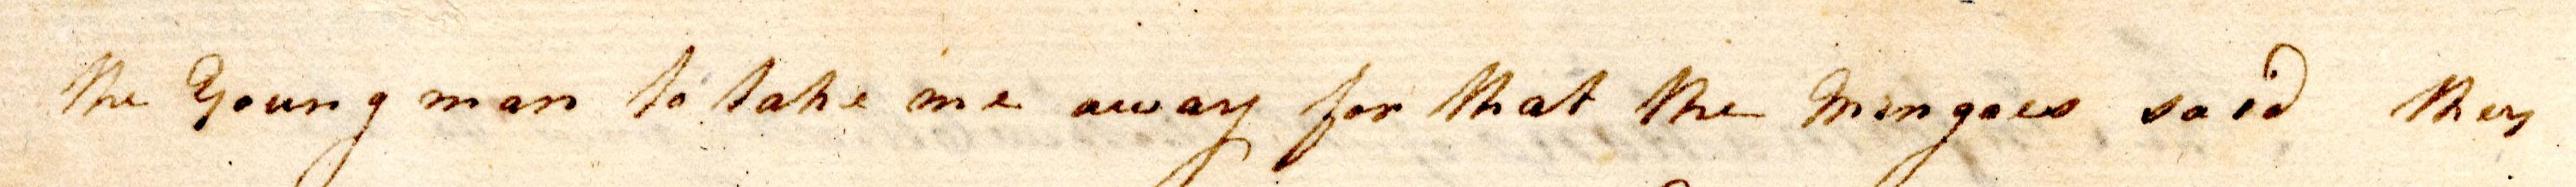the Young man to take me away for that the Mingoes said they
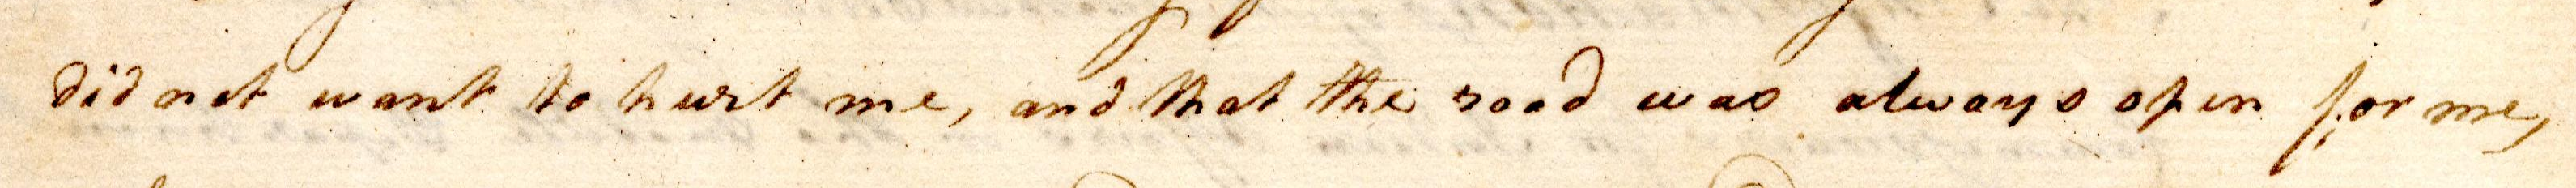did not want to hurt me, and that the road was always open for me,
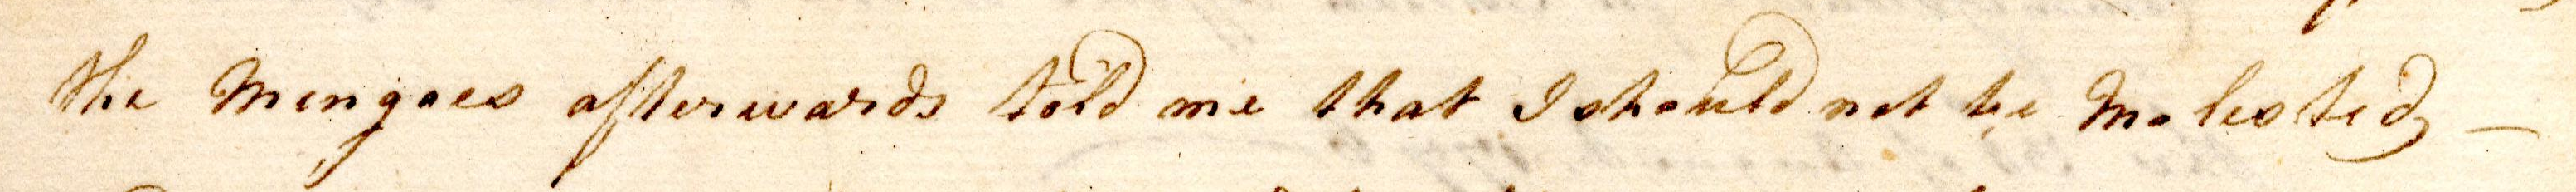the Mingoes afterwards told me that I should not be molested,-
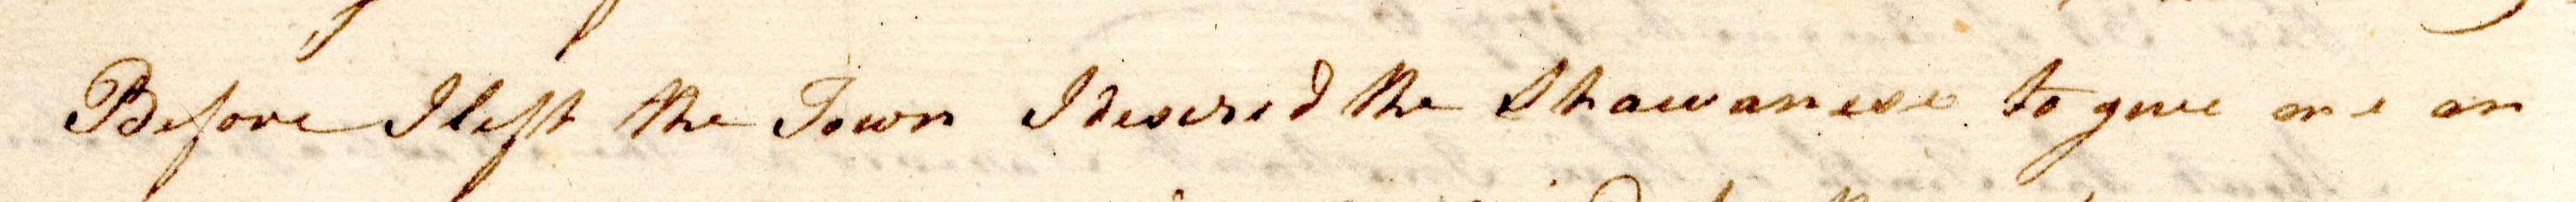Before I left the Town I desired the Shawanese to give me an
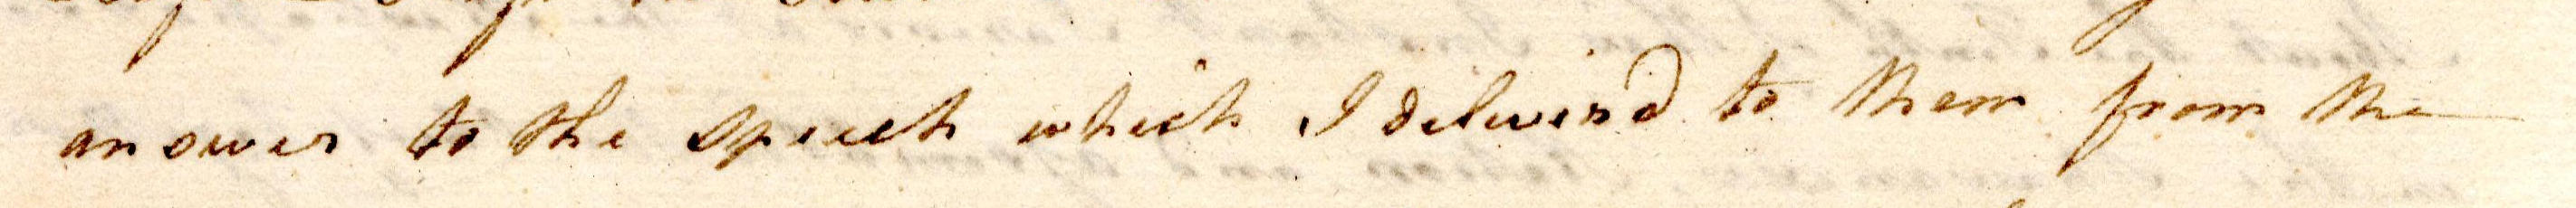answer to the speech which I deliver'd to them from the
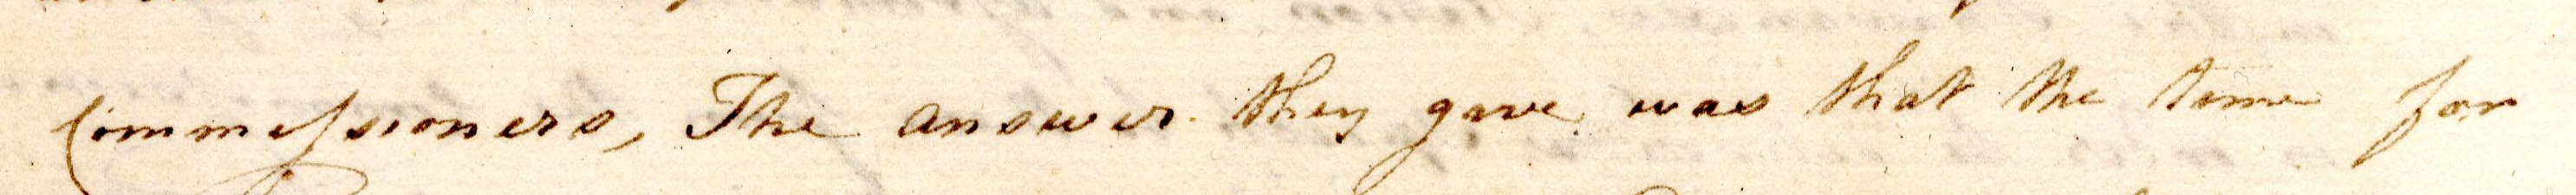Commissoners, The answer they gave was that the time for
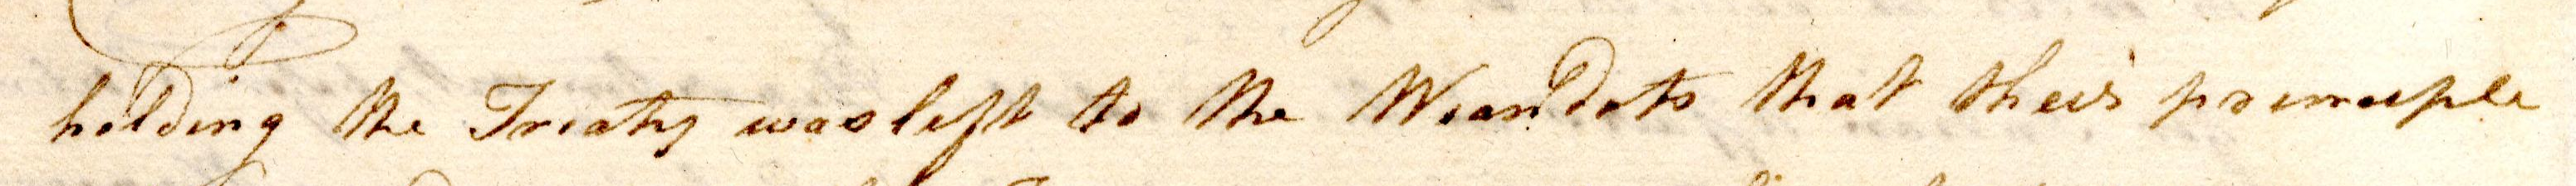holding the Treaty was left to the Wiandots that their principle
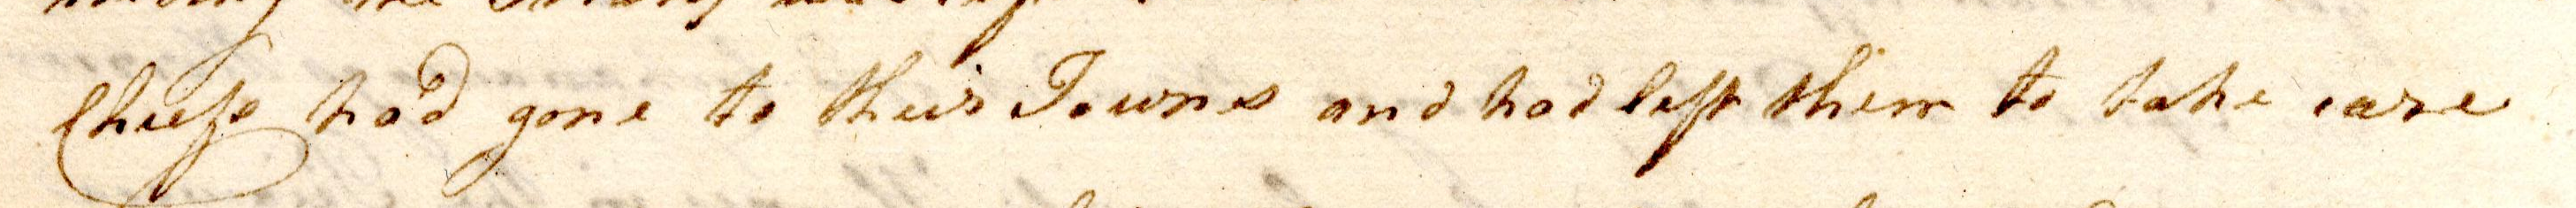Chiefs had gone to their Towns and had left them to take care
